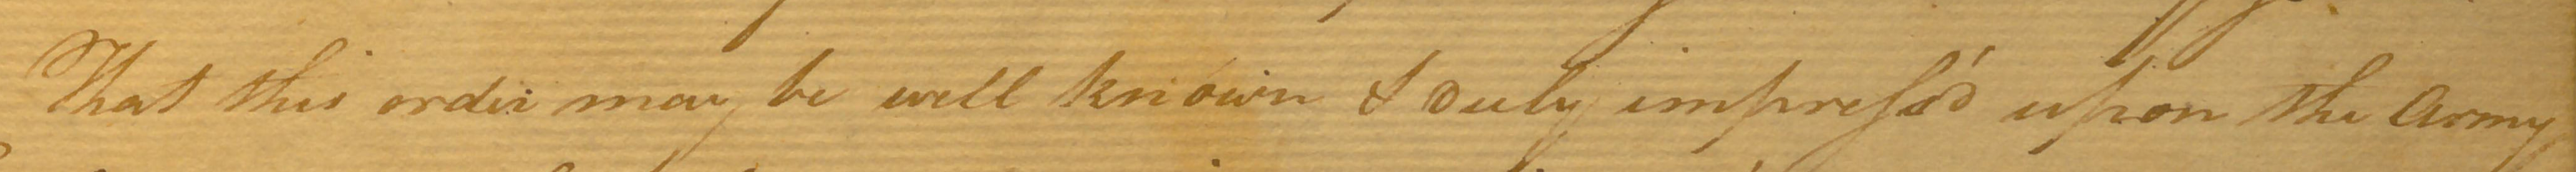That this order may be well known & duly impress'd upon the Army
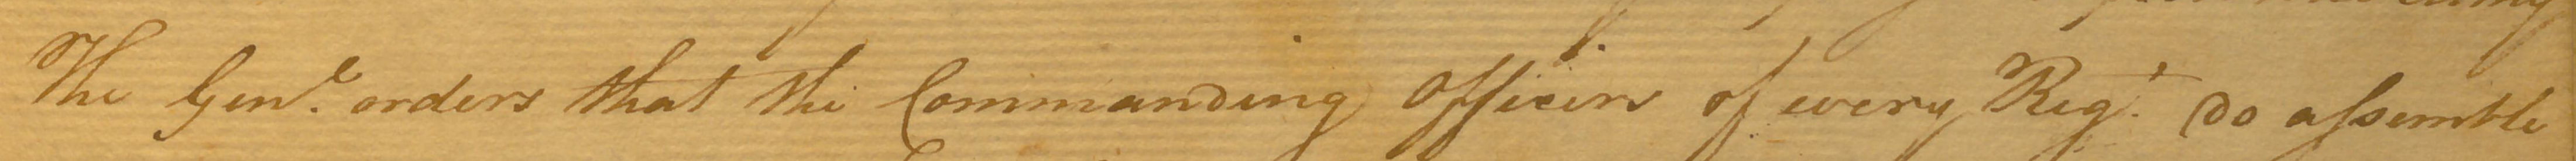The Gen^l. orders that the Commanding Officers of every Reg^t. do assemble
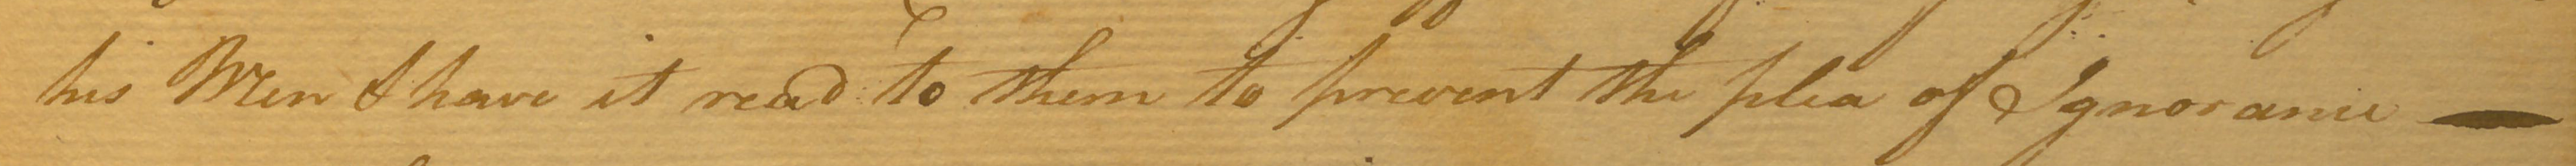his Men & have it read to them to prevent the plea of Ignorance-
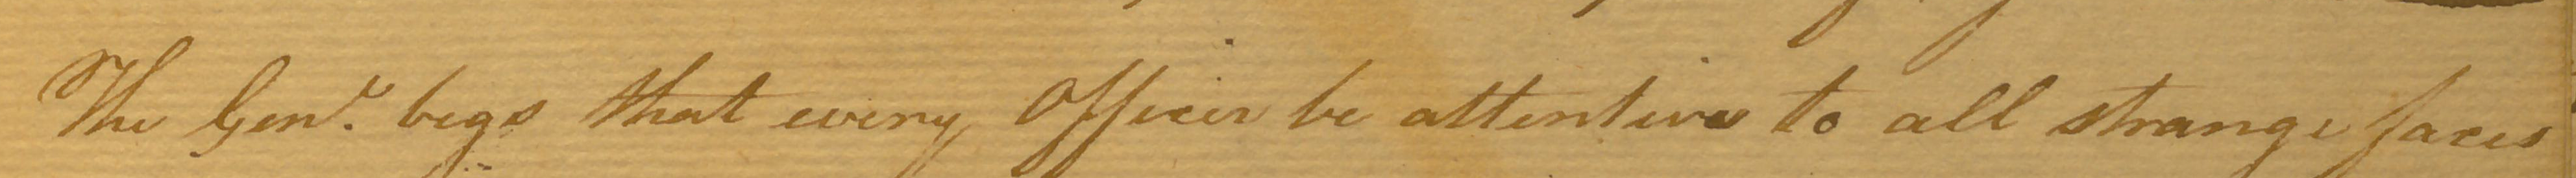The Gen^l. begs that every Officer be attentive to all strange faces
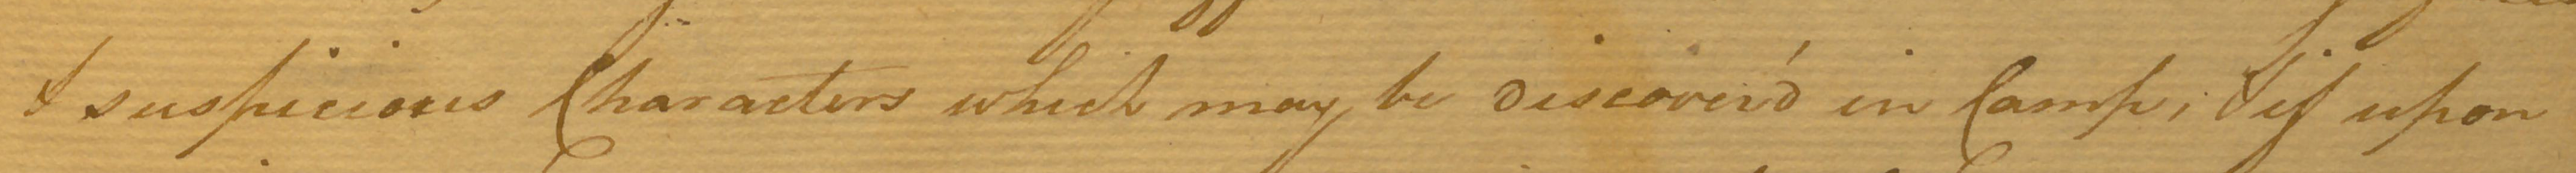& suspicious Characters which may be discover'd in Camp, & if upon
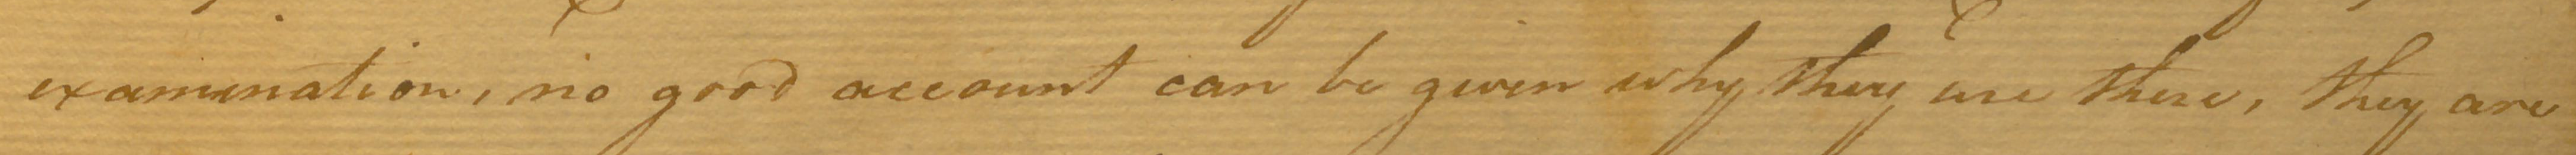examination, no good account can be given why they are there, they are
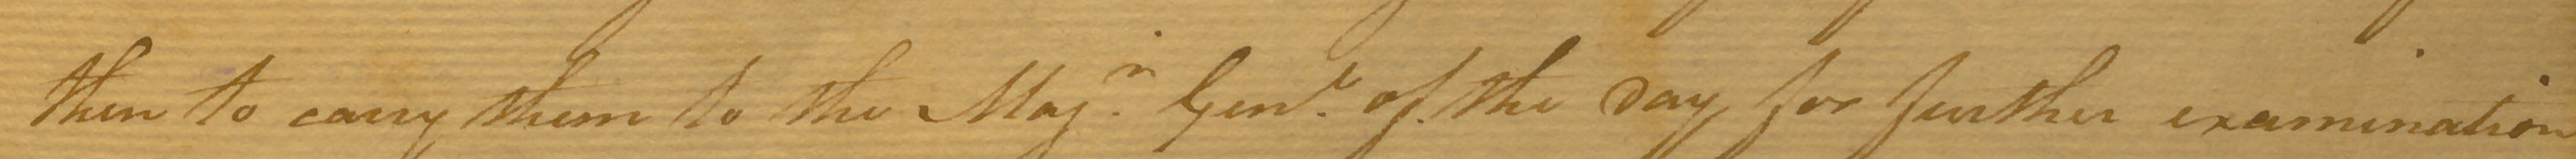then to carry them to the Maj^r. Gen^l. of the day for further examination
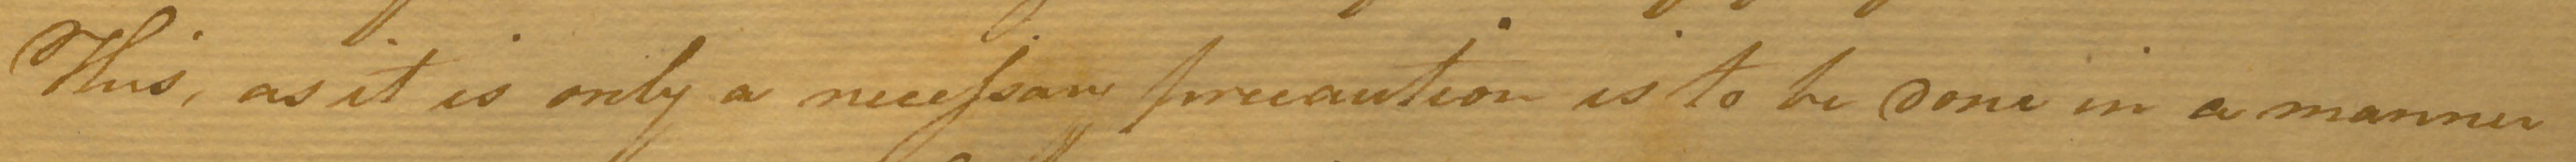This, as it is only a necessary precaution is to be done in a manner
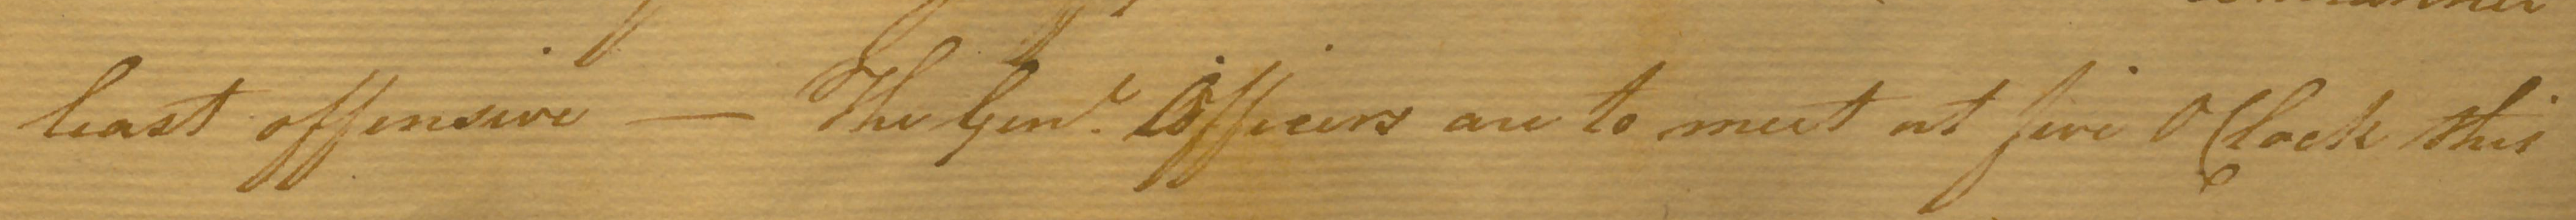least offensive- The Gen^l. Officers are to meet at five oClock this
